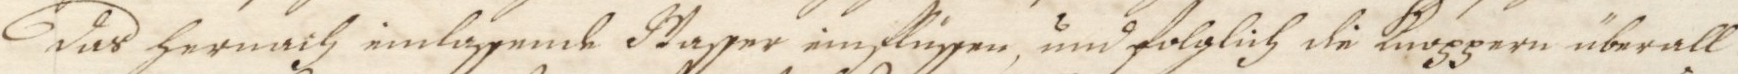das hernach einlassende Wasser einflüssen, und folglich die Knoppern überall
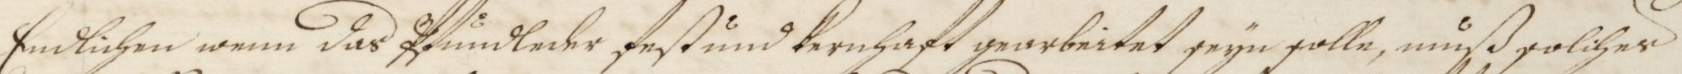Endlichen wenn das Pfundleder fest und Kernhaft gearbeitet seyn solle, muß solches
